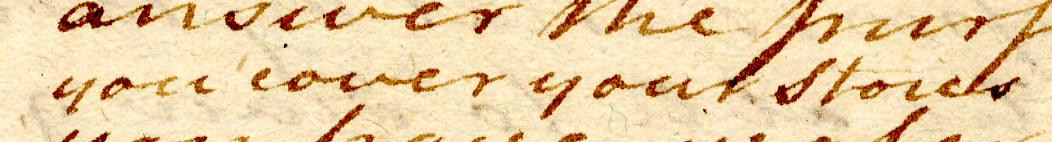you cover your stores
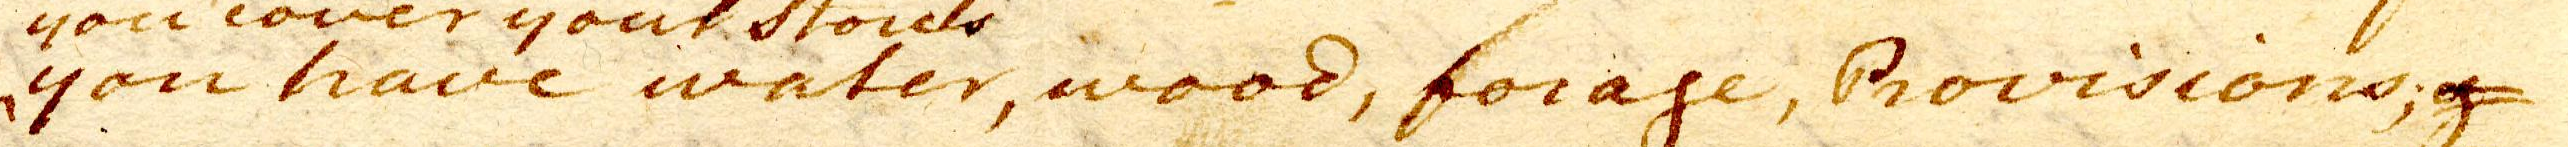^ You have water, wood, forage, Provisions; [&]
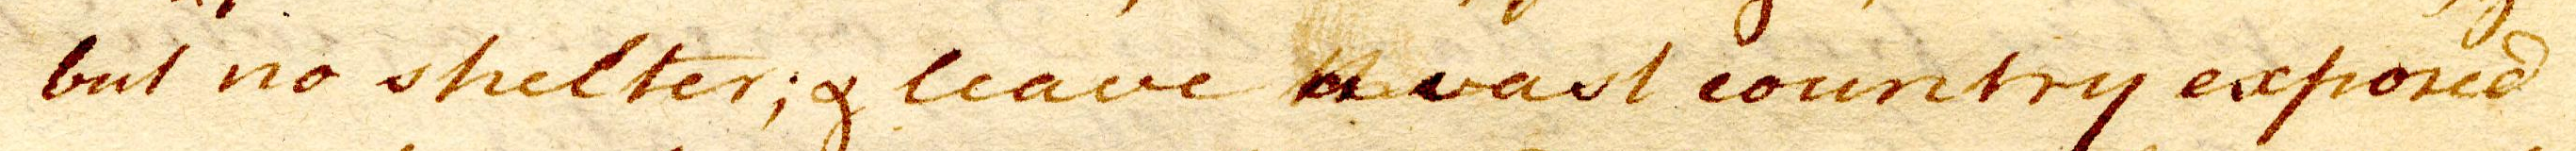but no shelter; & leave a vast country exposed
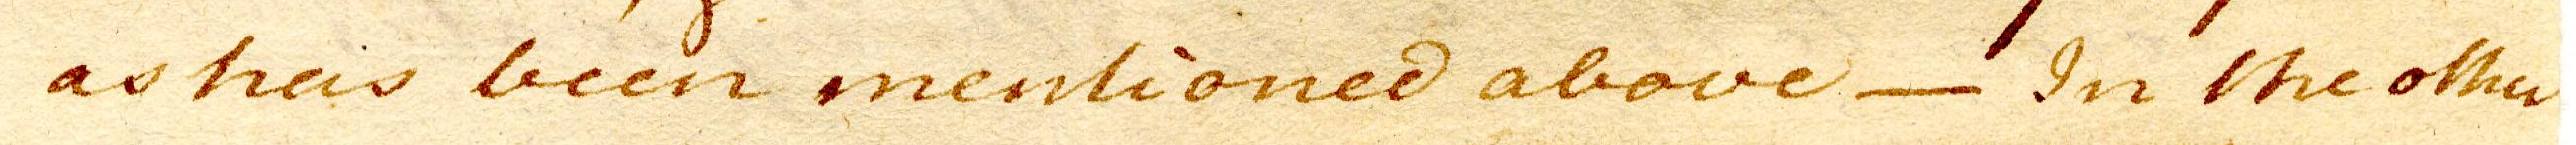as has been mentioned above- In the other
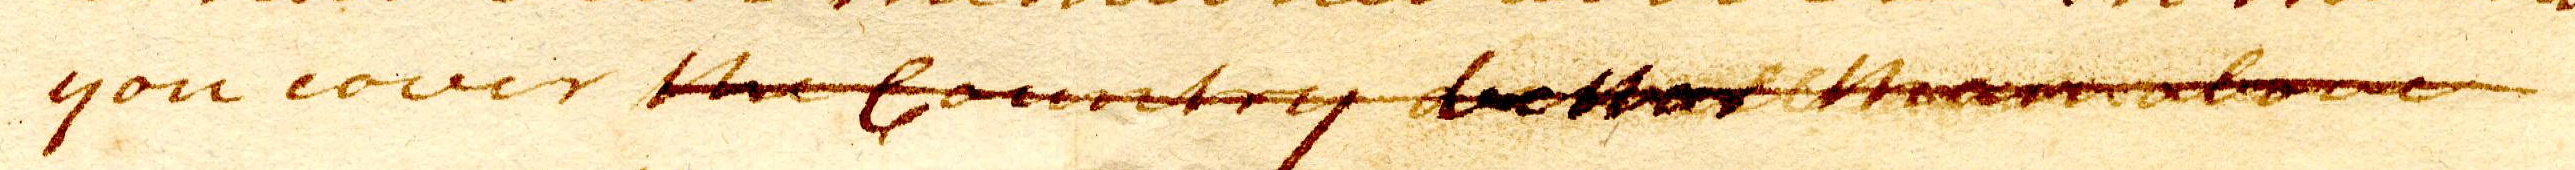you cover [the Country better than above]
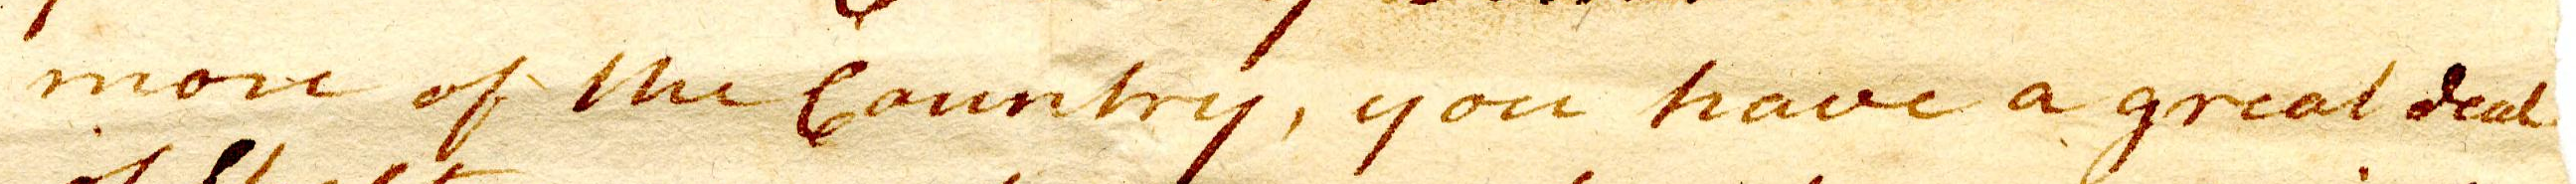more of the Country, you have a great deal
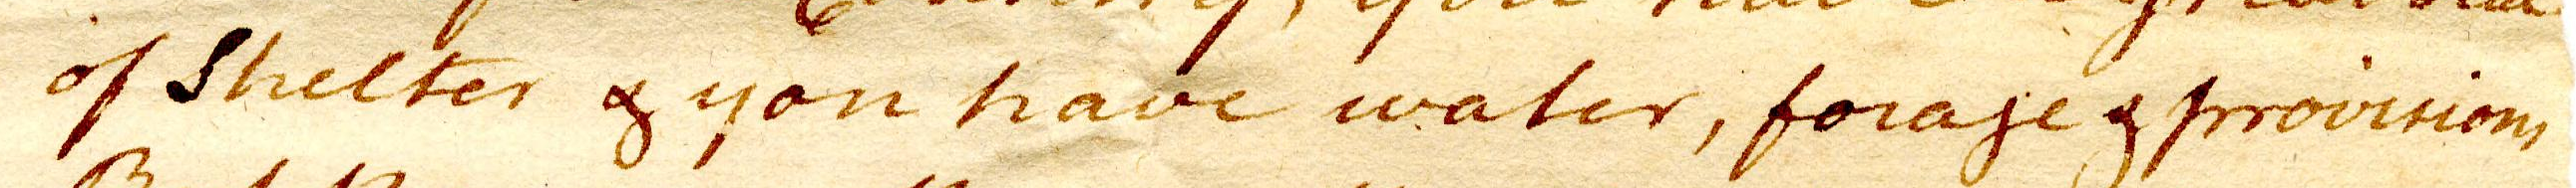of Shelter & you have water, forage & provisions
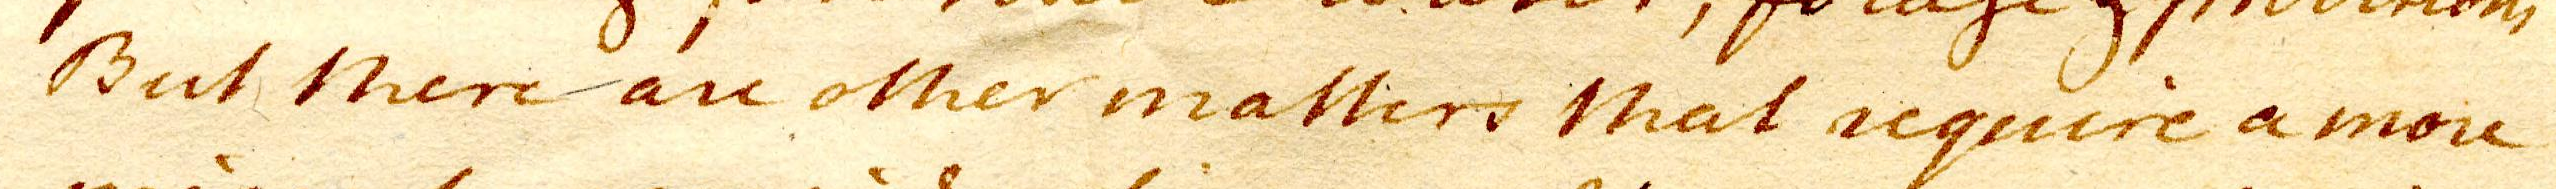But there are other matters that require a more
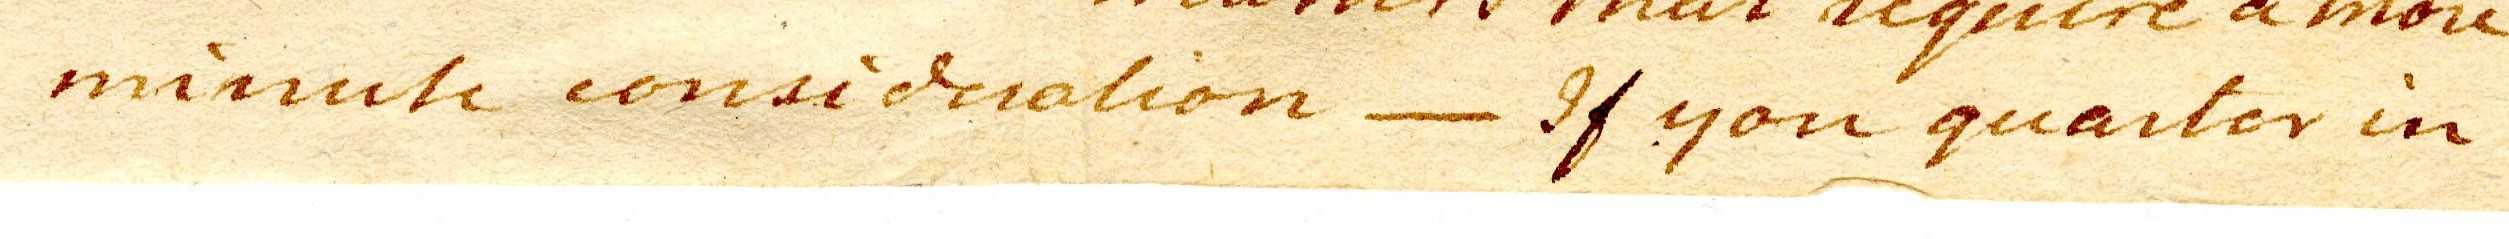minute consideration- If you quarter in
